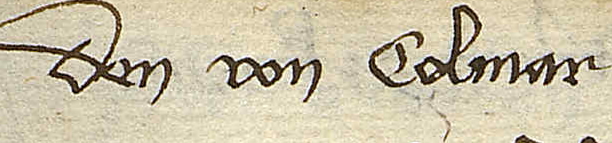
Den von Colmar
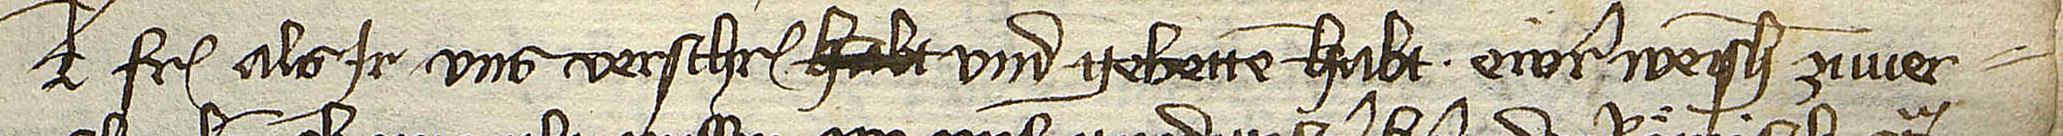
L* fr* als Ir vns verſchr* habt vnd gebette* habt . ewr* weiſh* ʒuuer =
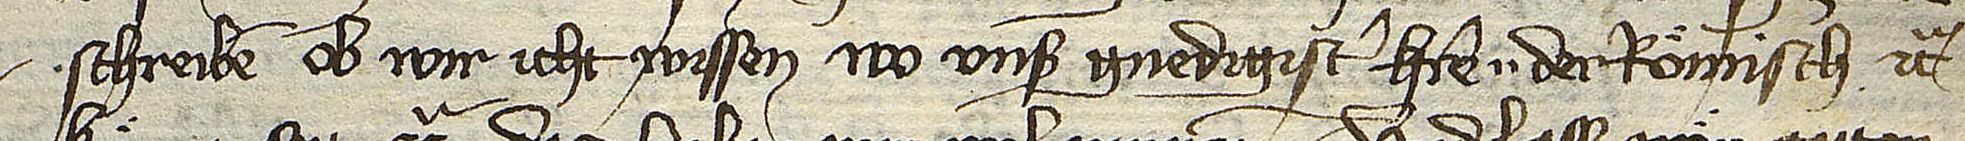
ſchreibe* ob wir icht wiſſen wo vnſ* gnedigiſt* hre* ~ der Römiſch ec*
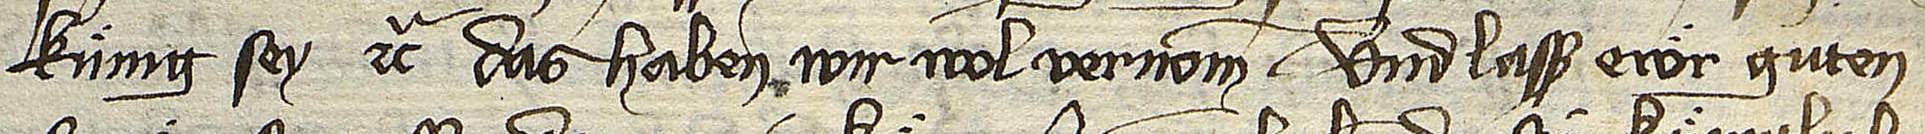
künig ſey ec* das haben wir wol vernom* / Vnd laſſ* ewr guten
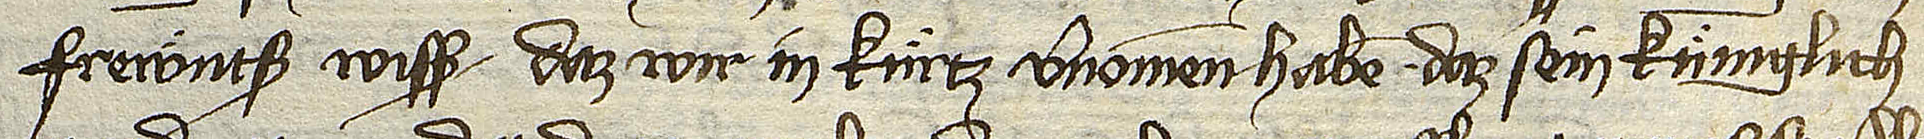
frewntſ* wiſſ* / daʒ wir in kürcʒ v*nomen* habe* . daʒ ſein küniglich
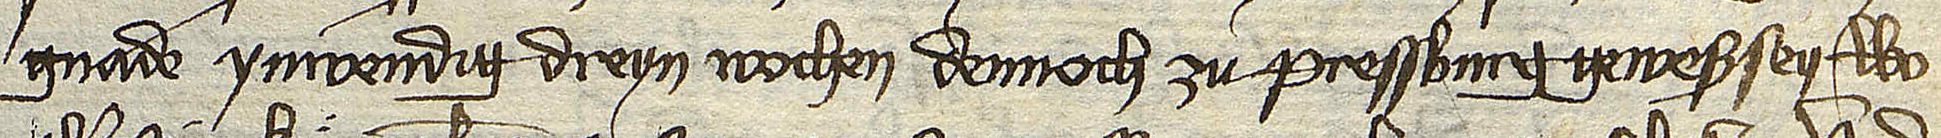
gnade ynwendig dreyn wochen dennoch ʒu Preſſburg geweſ* ſey Wo
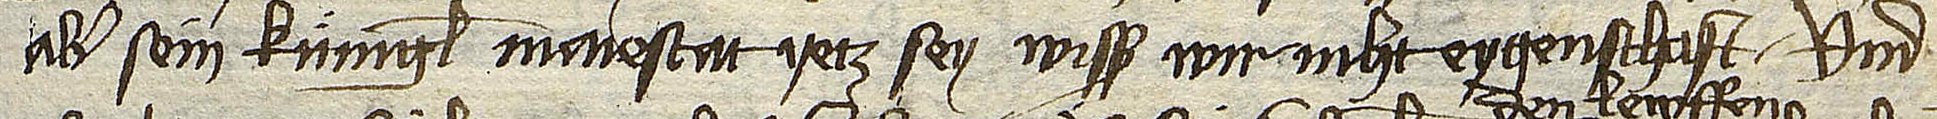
ab* ſein künigl* maieſtat yecʒ ſey wiſſ* wir niht eygenſchaft / Vnd
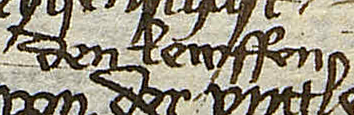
den lewffen
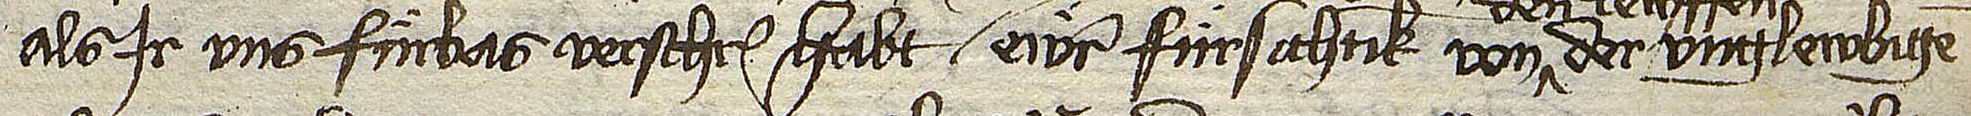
als Ir vns fürbas verſchr* habt / ewr* fürſichtik* von der vnglewbige*
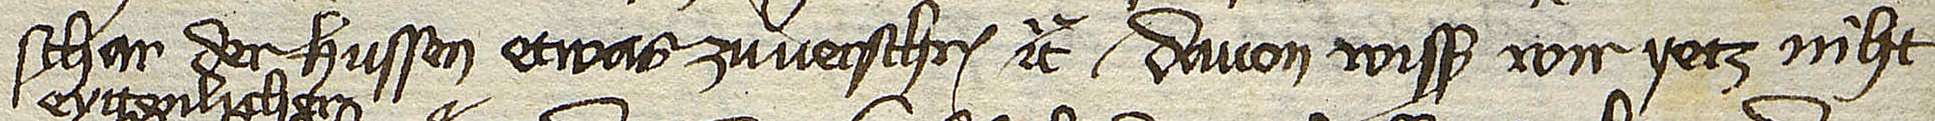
ſchar der huſſen etwas ʒuuerſchr* ec* / Dauon wiſſ* wir yecʒ niht
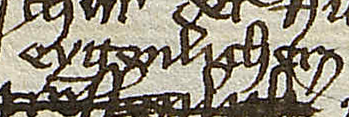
eygenlichen
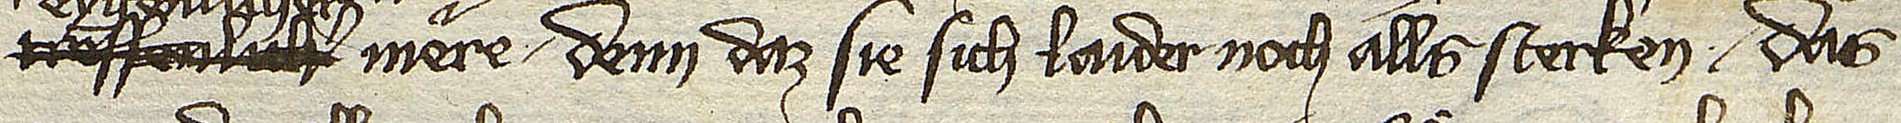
treffenlich* mëre / denn daʒ ſie ſich laider hoch alls ſterken / das
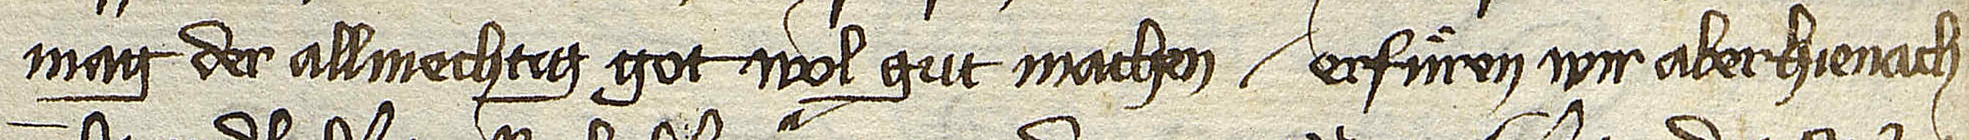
mag der allmechtig got wol gut machen / erfüren wir aber hienach
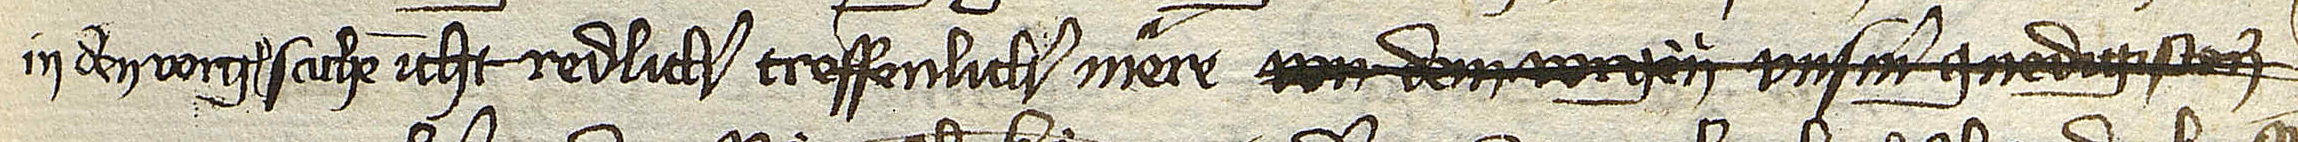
in der vorg* ſache* icht redlich* treffenlich* mëre von dem vorgen* vnſ*m gnedigiſten*
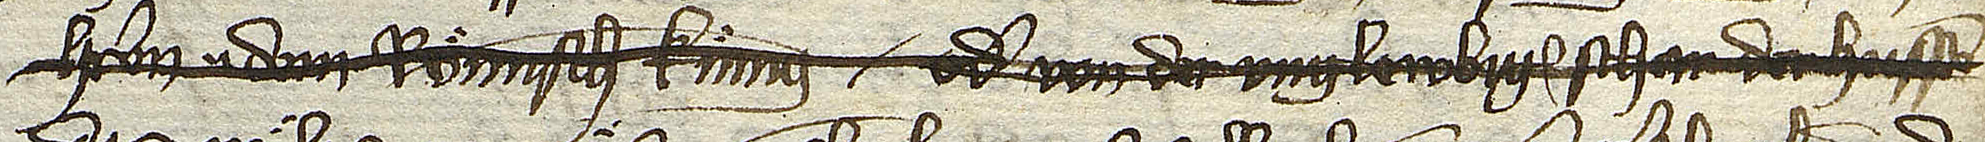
h*ren ~ dem Römiſch* künig / od* von der vnglewbig* ſchar der huſſe*
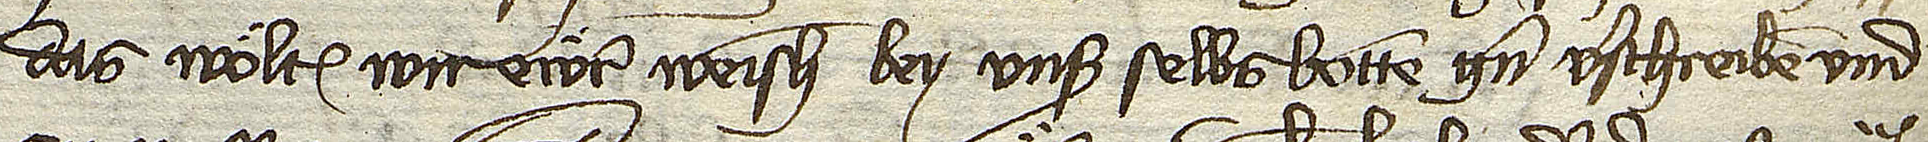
das wölt* wir ewr* weiſh* bey vnſ* ſelbs botte* gn* v*ſchreibe* vnd
